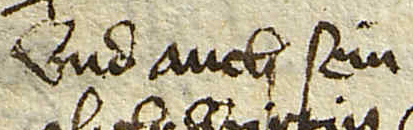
vnd auch ſein
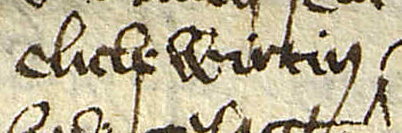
eliche wirtin
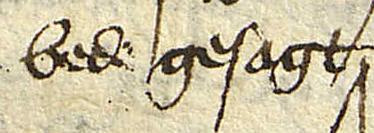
bede geſagt
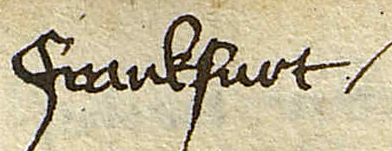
Frankfurt /
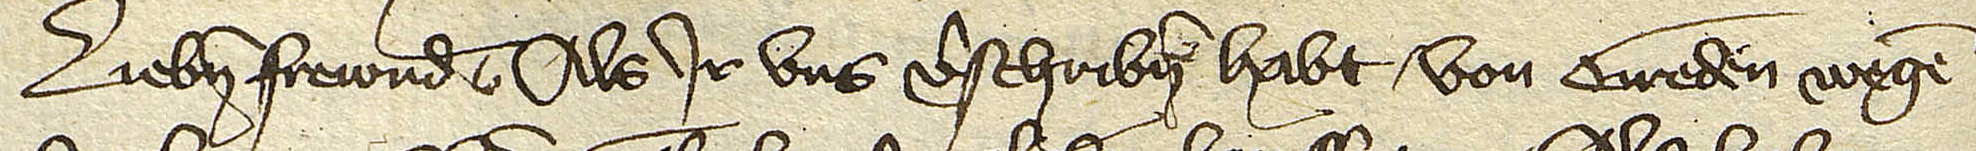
Liebn* frewnd / Als Ir vns v*ſchribn* habt / von Greden wege*
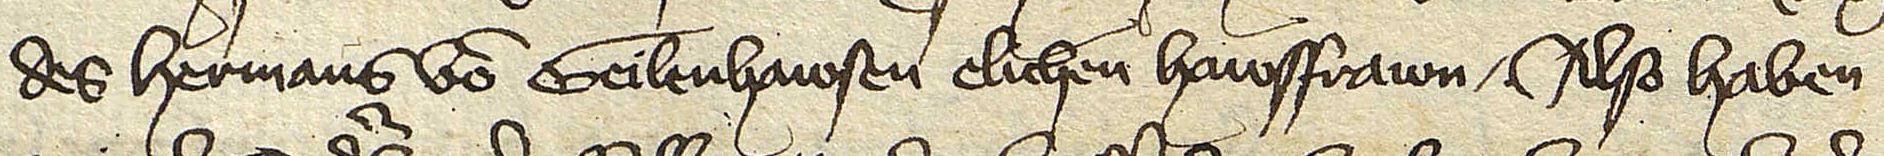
des hermans vo* Geilenhawſen elichen hawſfrawn / . Alſo haben
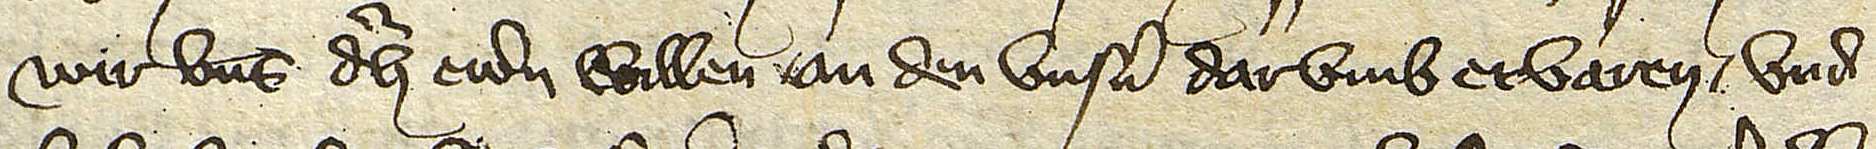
wir vns d*h ew*n willen / an den vnſn* darvmb ervaren / vnd
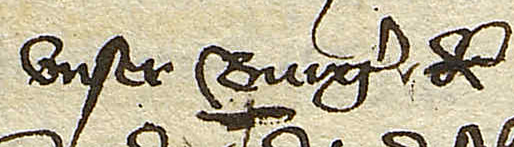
vnſer Burg* / d*
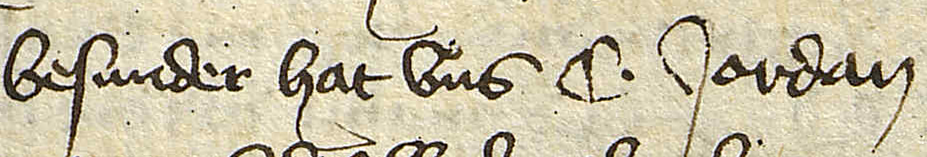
beſunder hat vns C . Iordan
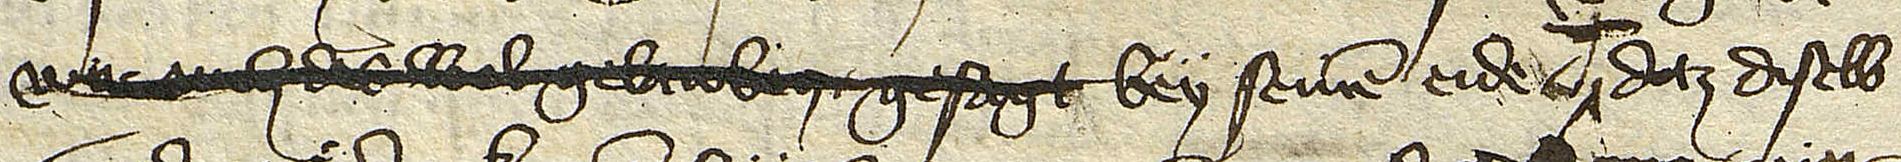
wir auch des wol gelawben / geſagt bey ſeine* eide / daʒ diſelb
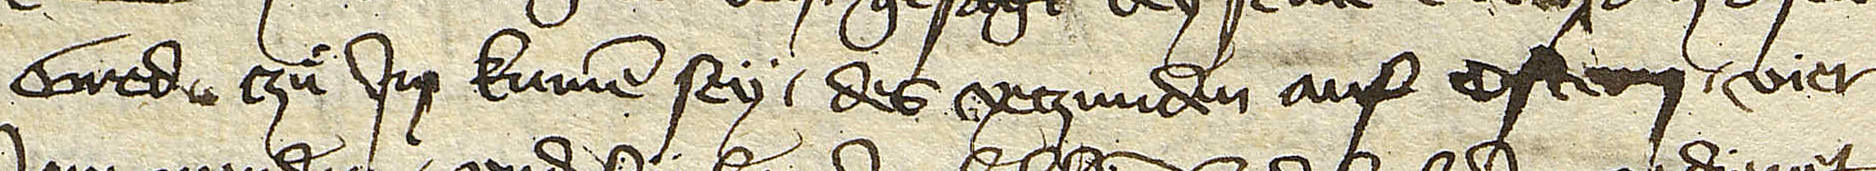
Gred cʒü In kume* ſey / des yecʒunden auf Oſtern / vier
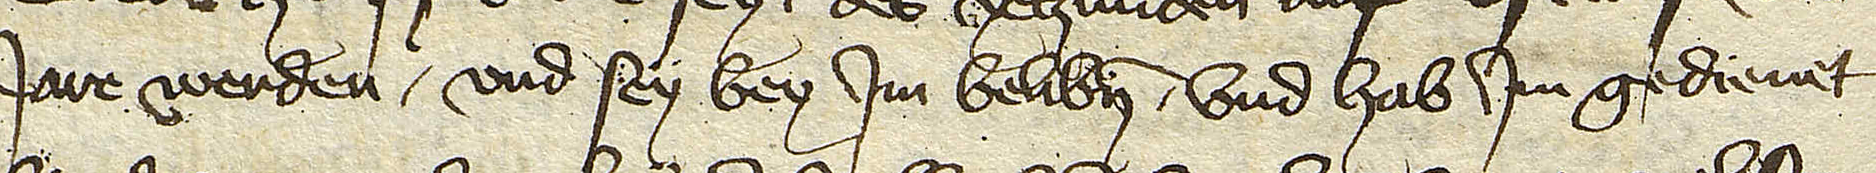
Iare werden / vnd ſey bey Im belibn* / vnd hab Im gedienet
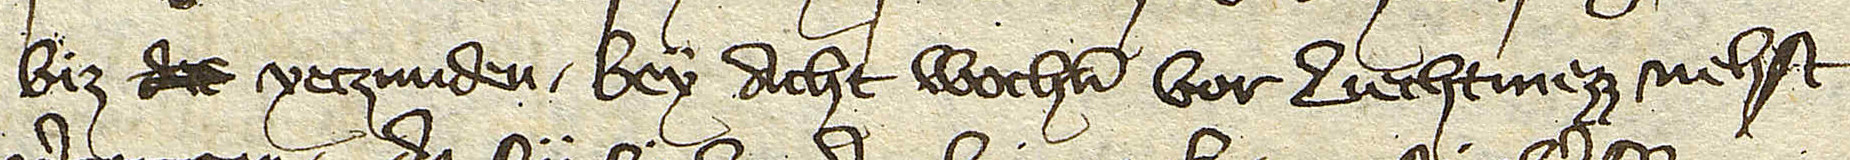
biʒ des yecʒunden / bey Acht wochn* vor Liechtmeʒʒ nehſt
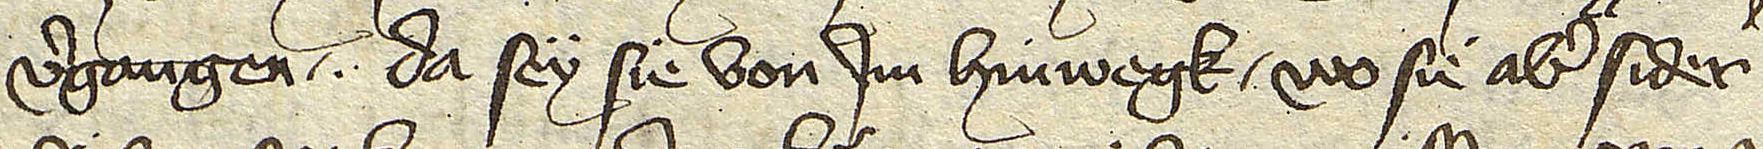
v*gangen / . da ſey ſie von Im hinwegk* / wo ſie ab* ſider
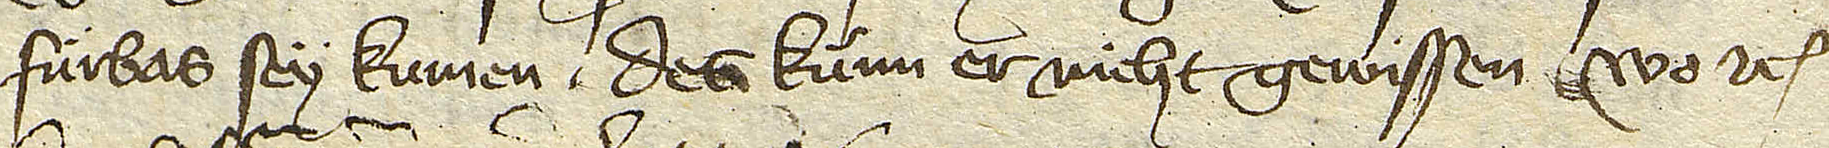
fürbas ſey kumen / des küm er nicht gewiſſen / wo ec*
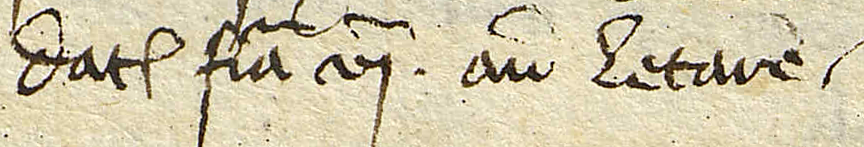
dat* fia* vi* . an* Letare /
